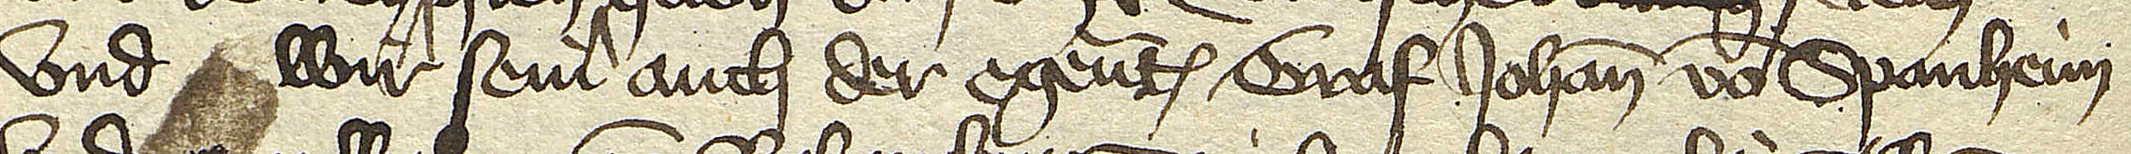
vnd wir ſein auch der egent* Graf Iohan* vo* Spanheim
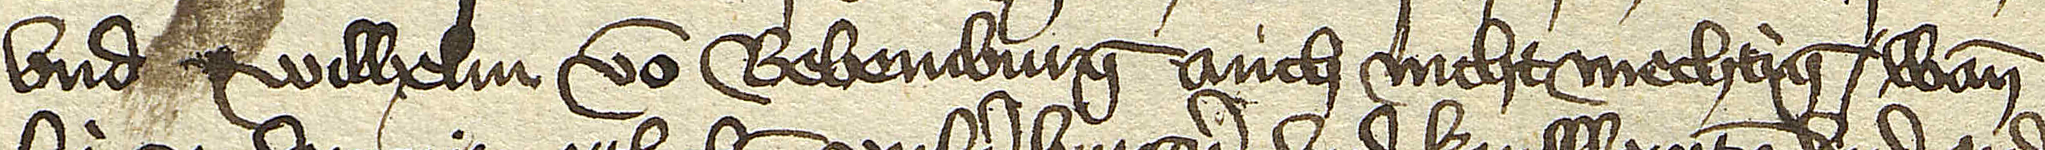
vnd wilhelm vo* Bebemburg auch nicht mechtig / wan*
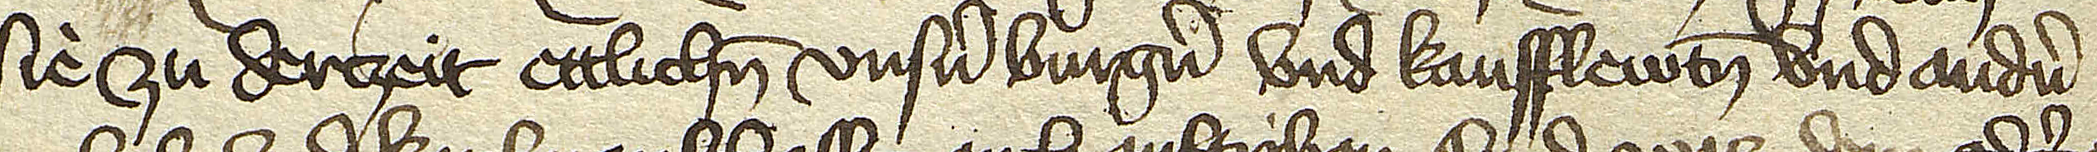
ſie cʒu dercʒeit ettlichn* vnſn* burgn* vnd kaufflewtn* vnd andn*
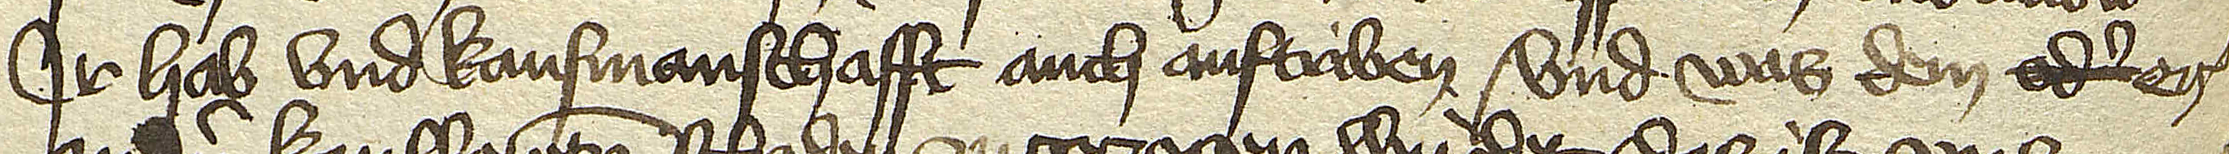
Ir hab vnd kaufmanſchafft auch auftriben / vnd was dem od* eg*
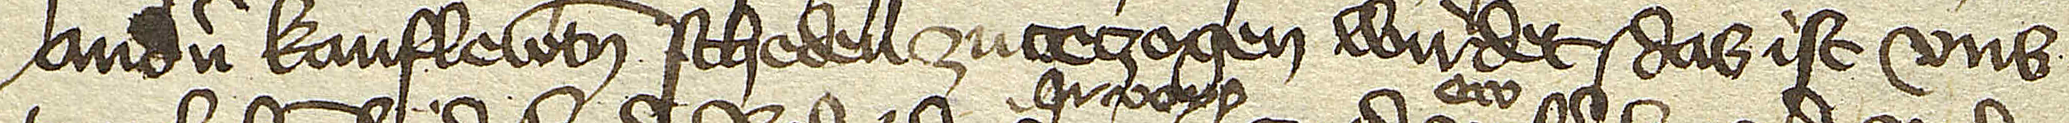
andn* kauflewtn* ſcheden cʒugecʒogen wirdet / das iſt vns
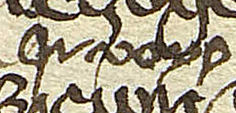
Ir von
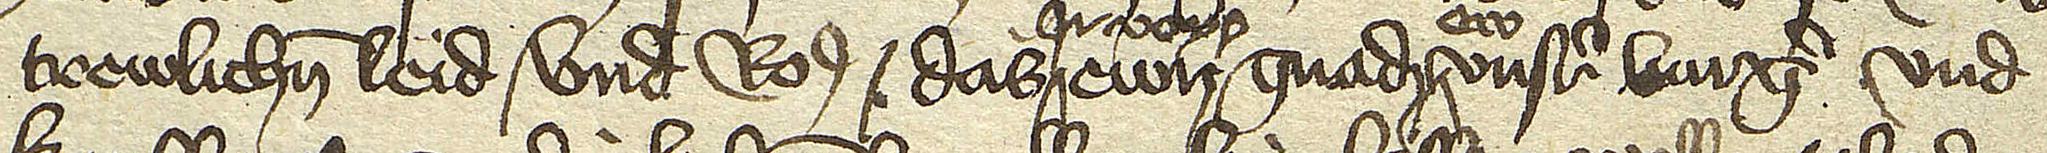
trewlichn* leid / vnd Ro* / das ewn* gnad vnſ*r burg* vnd
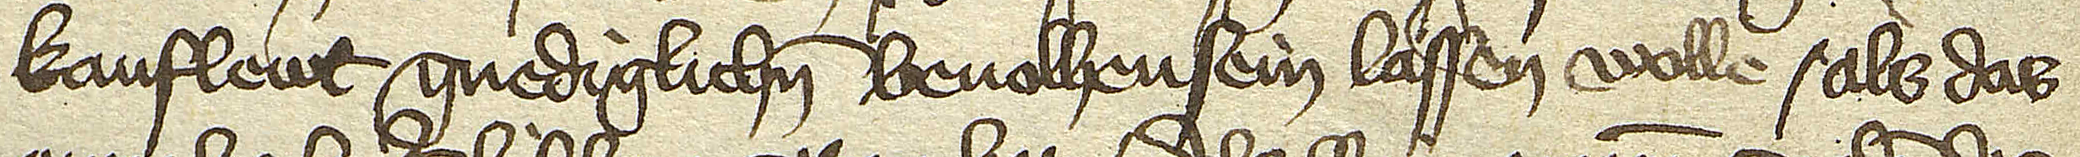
kauflewt gnediglichn* beuolhen ſein laſſen wolle / als das
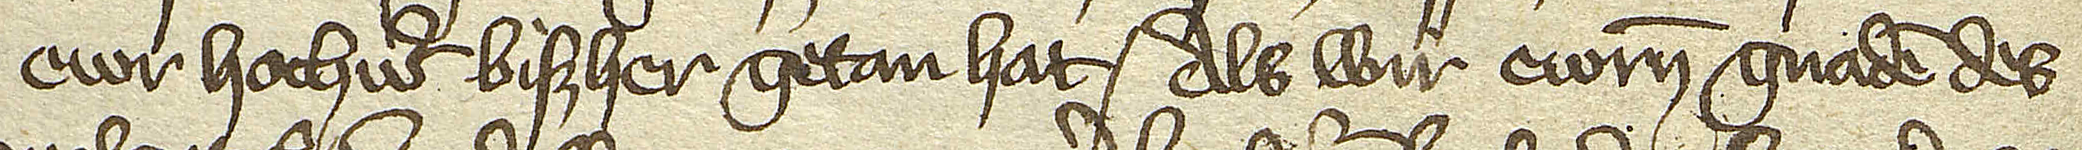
ewr hochw* biſʒher getan hat / Als wir ewrn* gnade* des
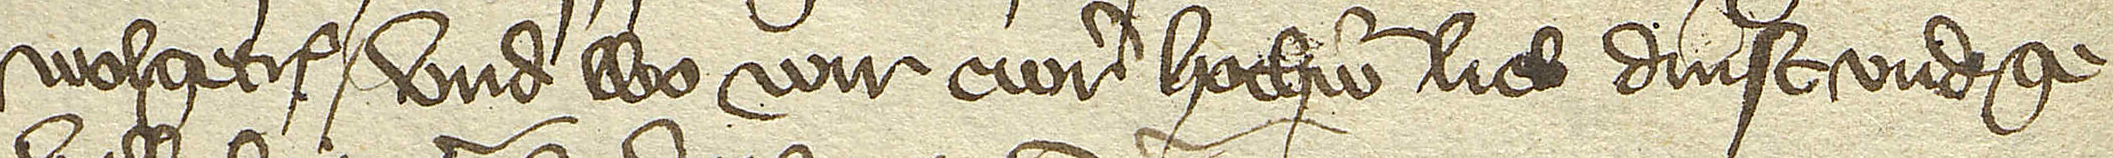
wolgetr* vnd wo wir ewr* hochw* lieb dinſt vnd ge
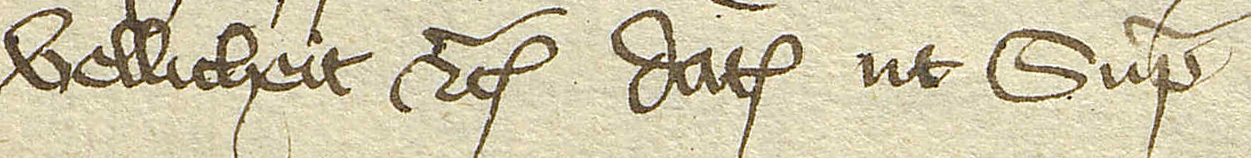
vellicheit ec* dat* ut Sup*
